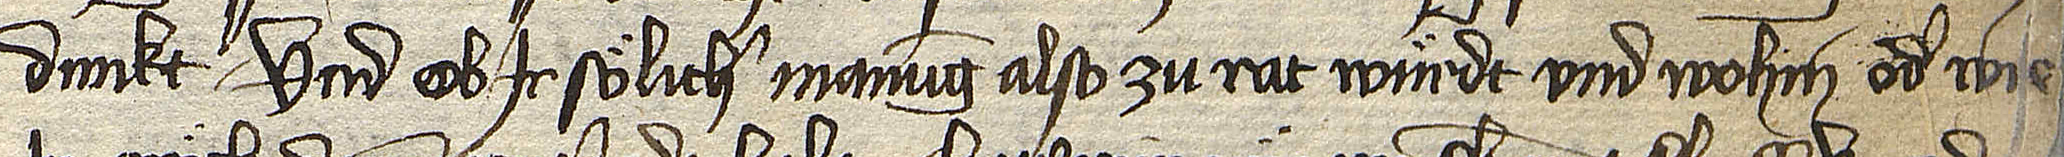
dunkt / Vnd Ob Ir ſölich* manug* alſo ʒu rat würdt vnd wohin od* wie
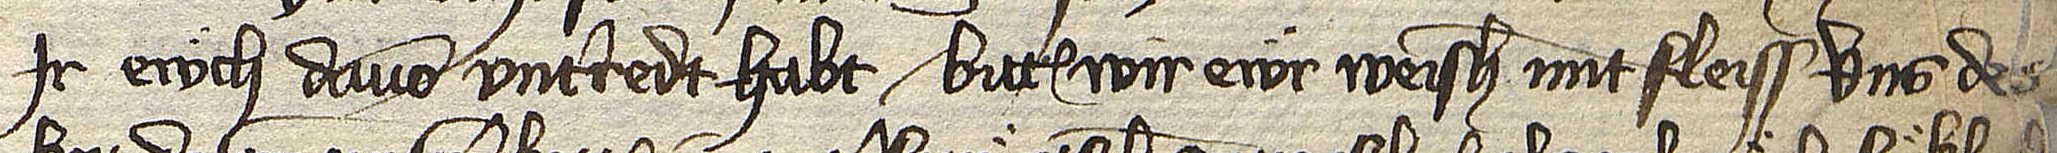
Ir ewch dauo* vnt*redt habt / bitt* wir ewr weiſh* mit fleiſſ vns des
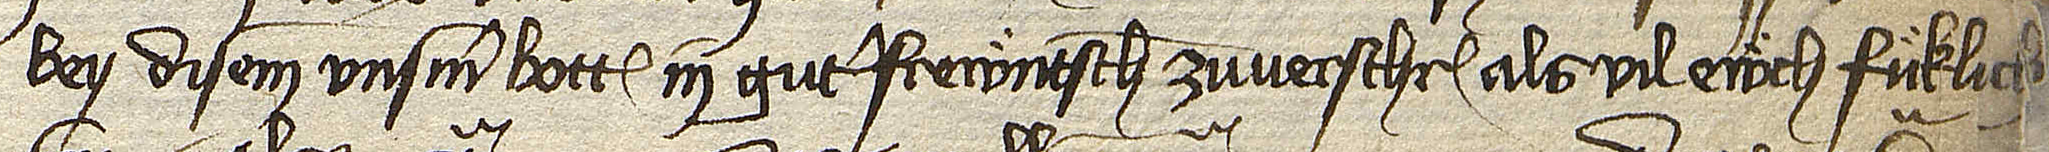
bey diſem vnſm* bott* in gut* frewntſch* ʒuuerſchr* als vil ewch füklich
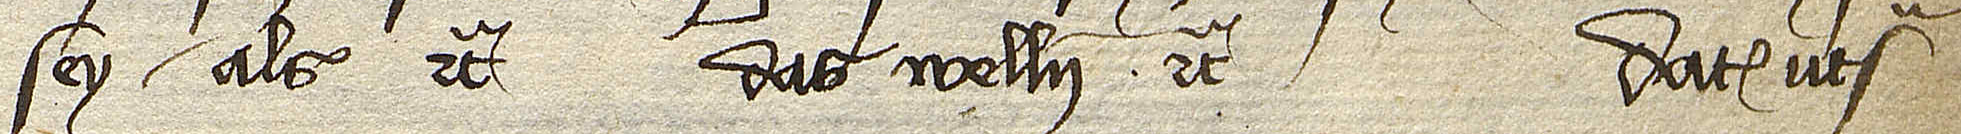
ſey / als ec* das welln* . ec* Dat* ut ſ*
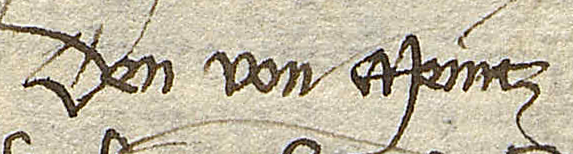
Den von Meincʒ
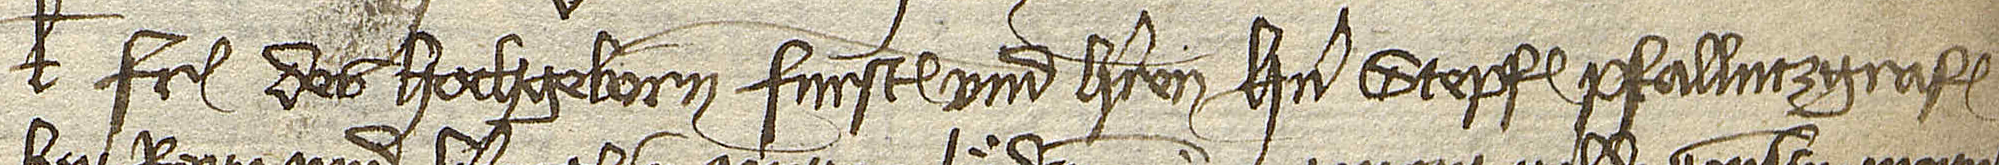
L* fr* des hochgeborn* furſt* vnd h*ren Hn* Stepf* Pfallncʒgraf*
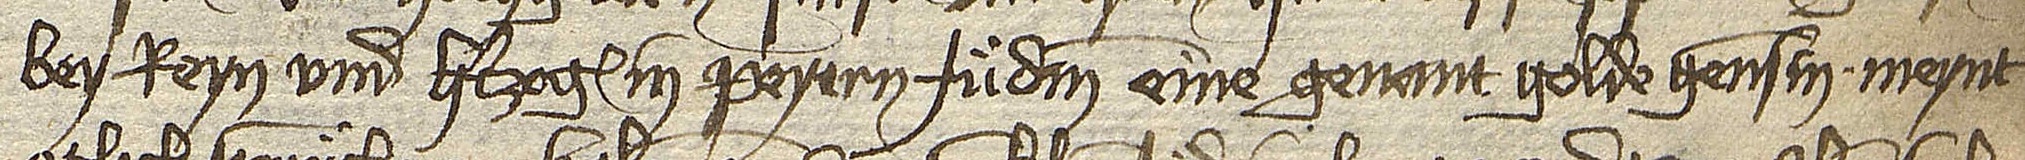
bey Reyn vnd h*cʒog* in Peyern Iüdin* eine genant golde genſin* . meynt
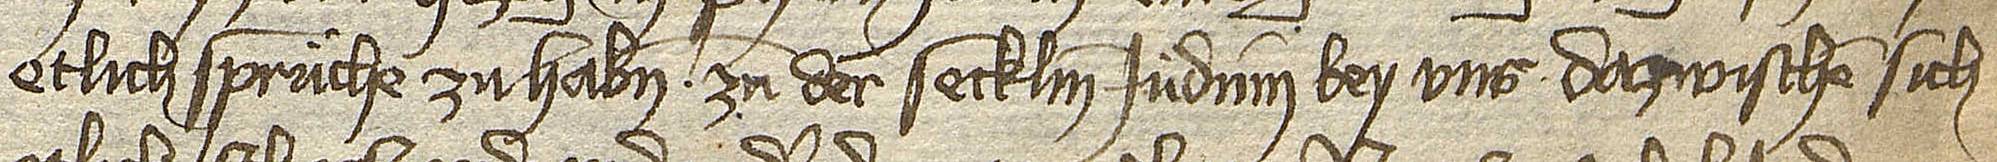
etlich ſprüche ʒu habn* . ʒu der ſecklin Iüdinn bey vns . daʒwiſche* ſich
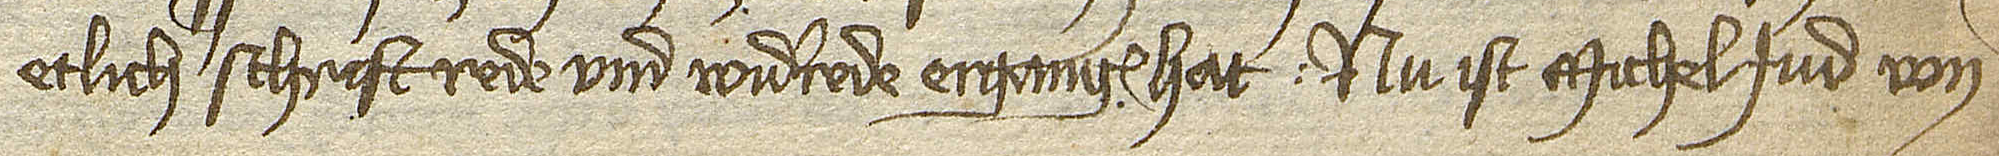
etlich ſchrift rede vnd wid*rede ergang* hat : Nu iſt Michel Iud von
